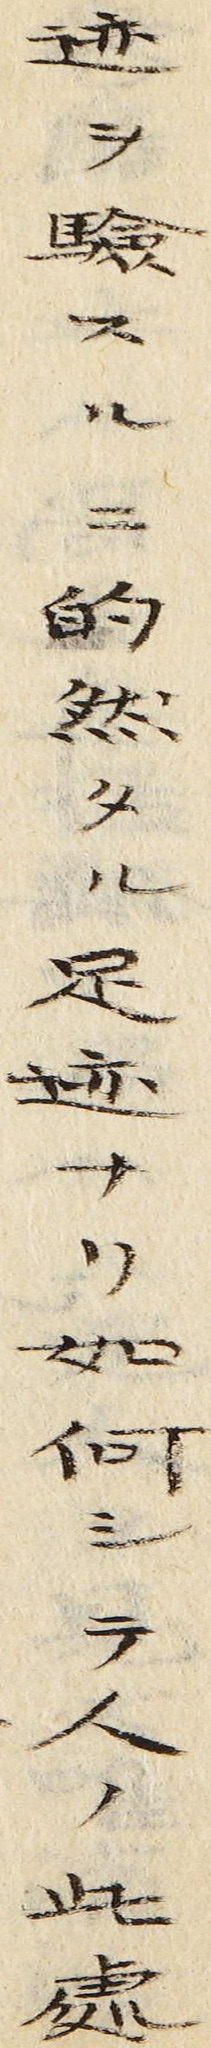迹ヲ験スルニ的然タル足迹ナリ如何シテ人ノ此処
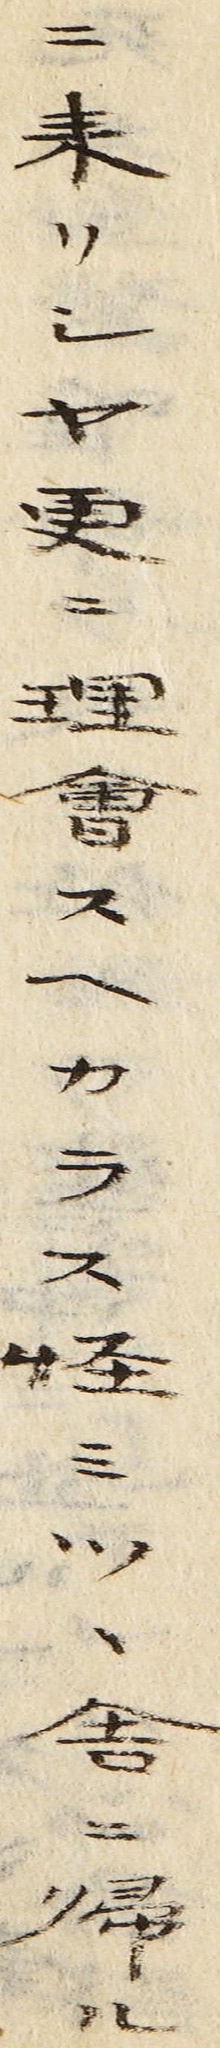ニ来リシヤ更ニ理会スヘカラス怪ミツヽ舎ニ帰ル
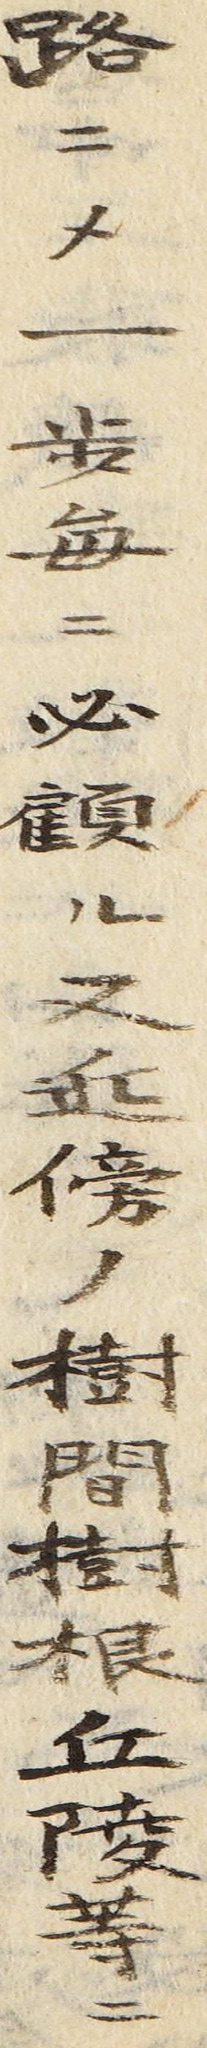路ニシテ一歩毎ニ必顧ル又近傍ノ樹間樹根丘陵等ニ
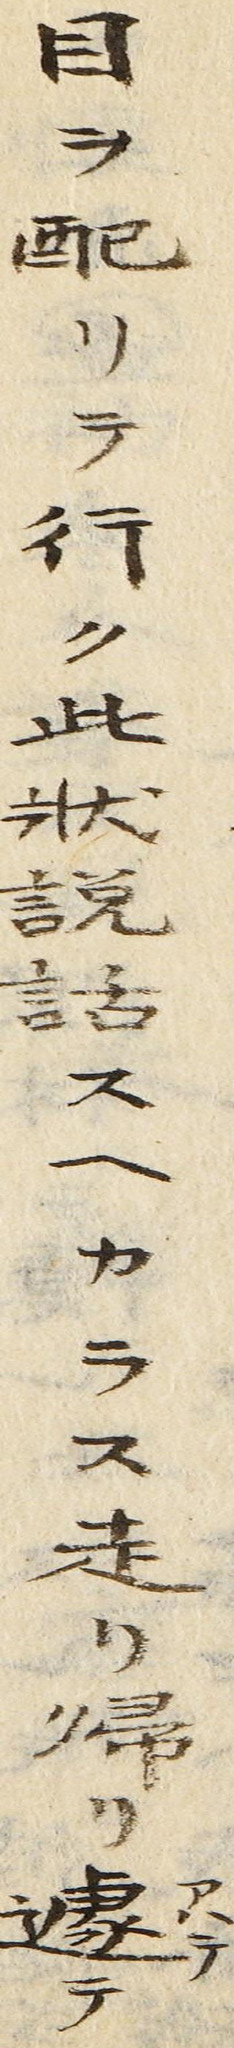目ヲ配リテ行ク此状説話スヘカラス走リ帰リ遽テ
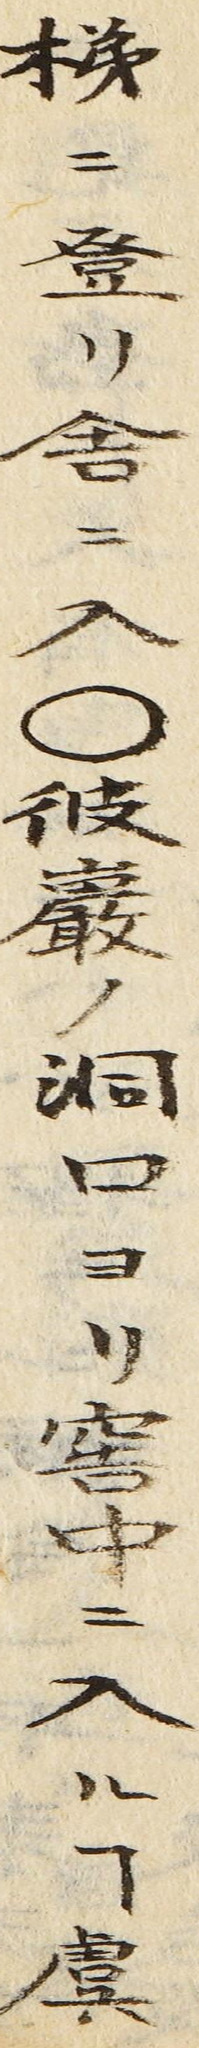梯ニ登リ舎ニ入◯彼巌ノ洞口ヨリ窖中ニ入ルコト虞
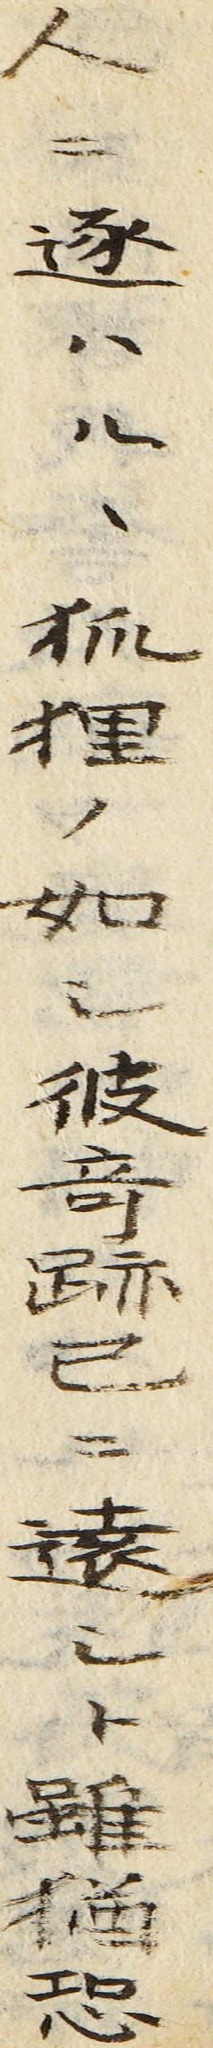人ニ逐ハルヽ狐狸ノ如シ彼奇跡已ニ遠シト雖猶恐
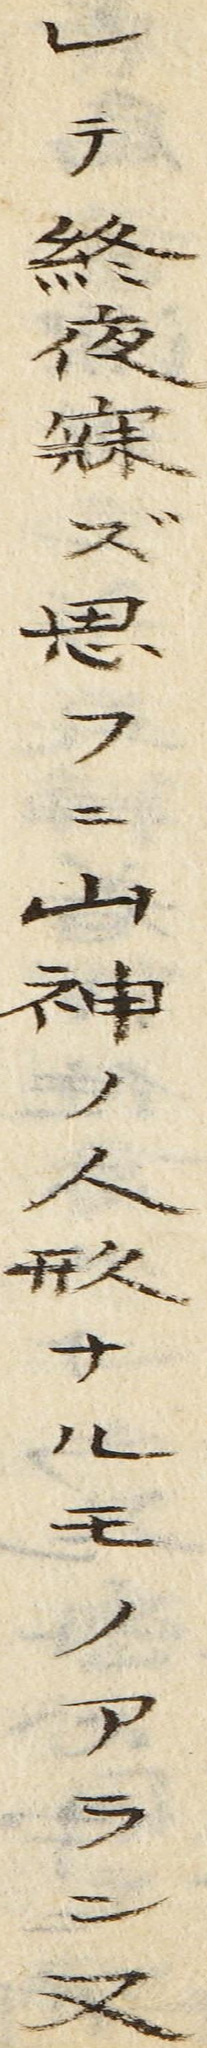レテ終夜寐ズ思フニ山神ノ人形ナルモノアラン又
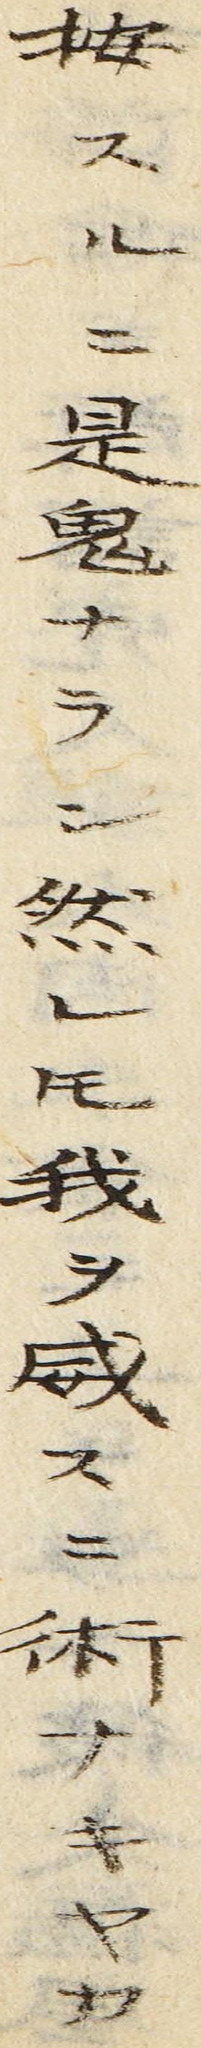按スルニ是鬼ナラン然レトモ我ヲ威スニ術ナキヤカ
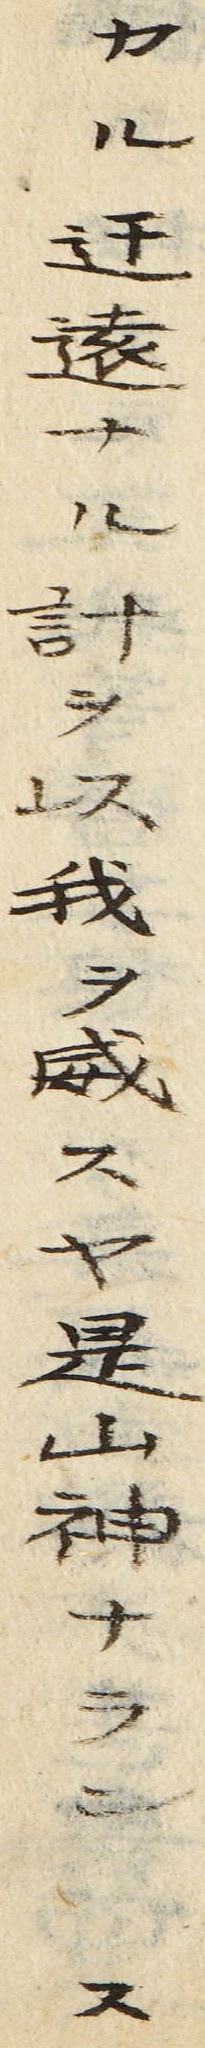カル迂遠ナル計ヲ以我ヲ威スヤ是山神ナランス

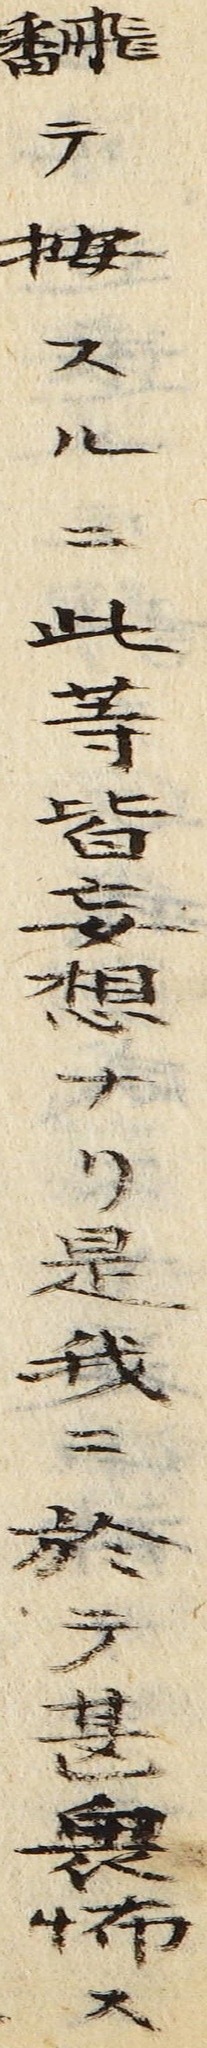翻テ按スルニ此等皆妄想ナリ是我ニ於テ甚畏怖ス
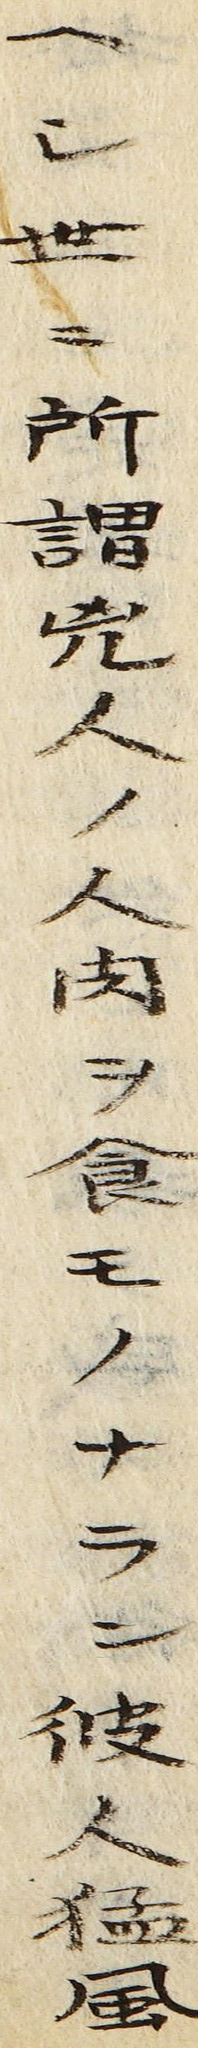ヘシ世ニ所謂兇人ノ人肉ヲ食モノナラン彼人猛風
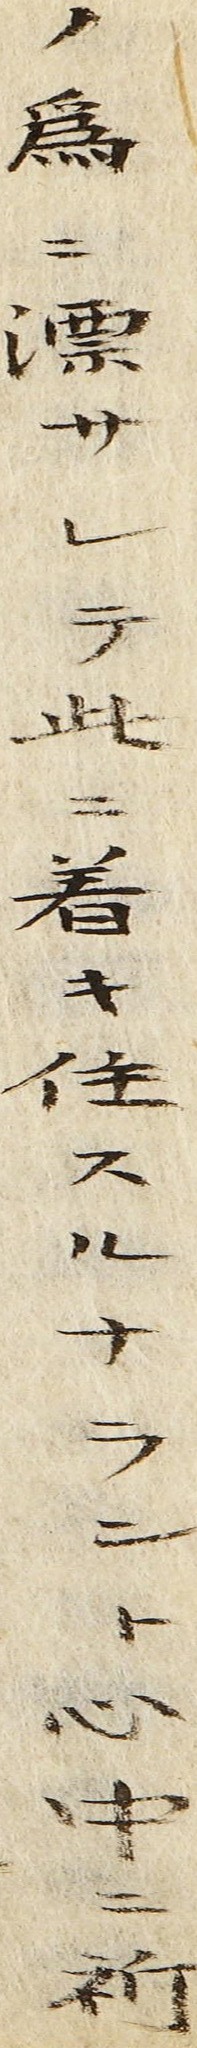ノ為ニ漂サレテ此ニ着キ住スルナラント心中ニ祈
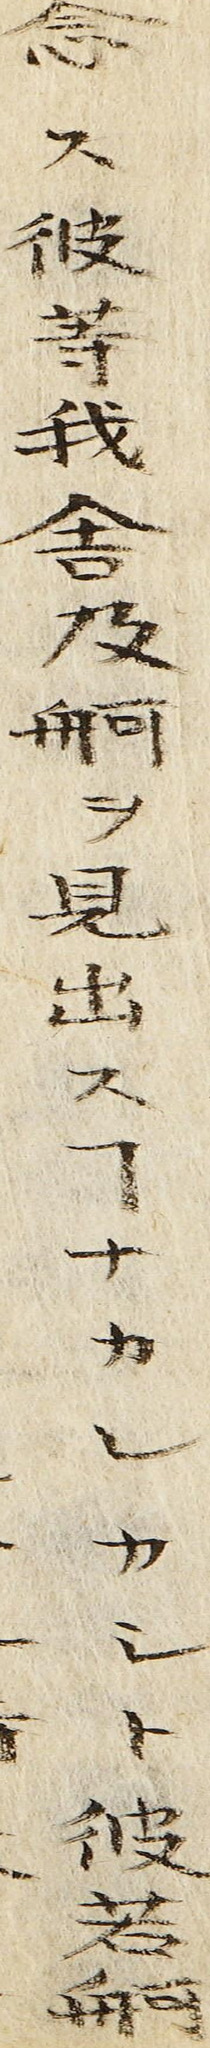念ス彼等我舎及舸ヲ見出スコトナカレカシト彼若舸
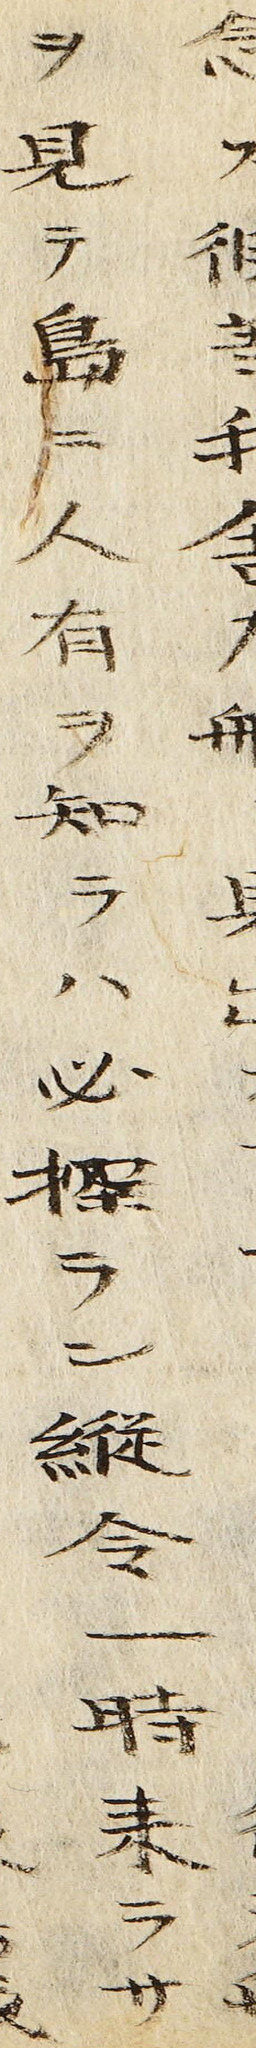ヲ見テ島ニ人有ヲ知ラハ必探ラン縱令一時来ラサ
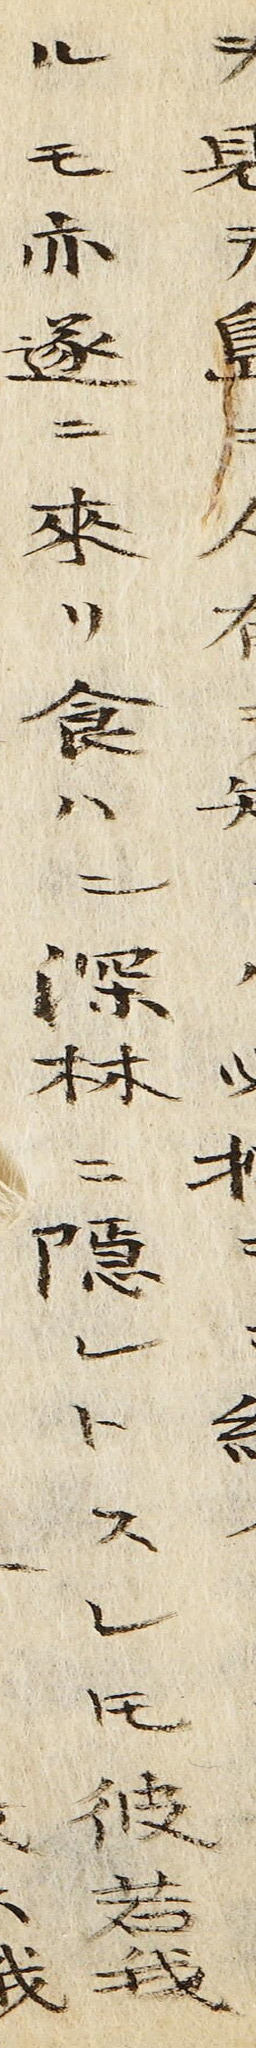ルモ亦遂ニ来リ食ハン深林ニ隠レトスレトモ彼若我
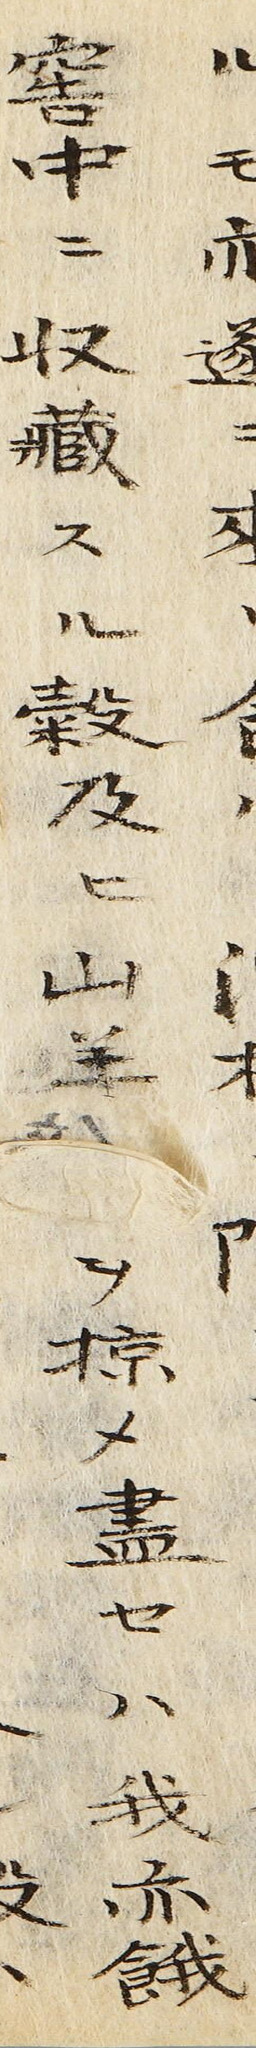窖中ニ収蔵スル穀及ヒ山羊ヲ掠メ尽セハ我亦餓
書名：漂流紀事
